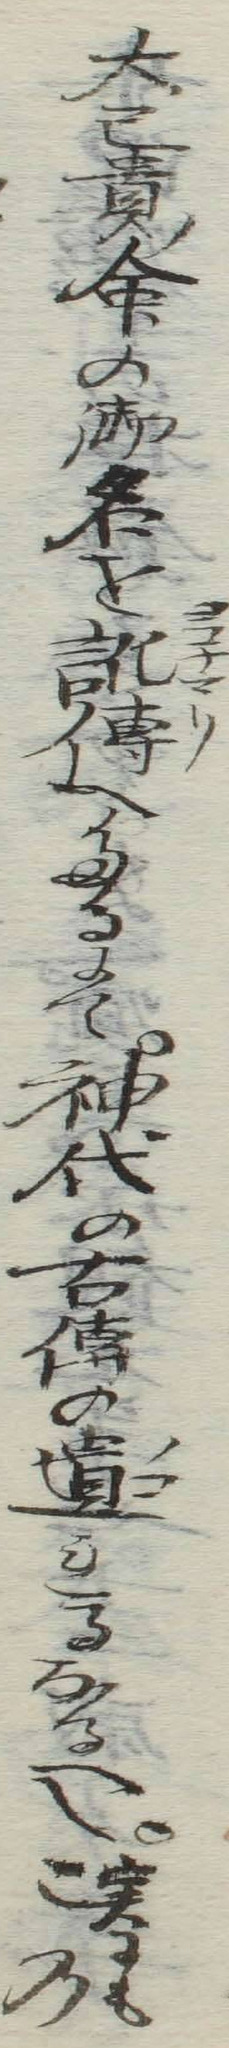大已貴命の御名を訛伝へたるにて。神代の古伝の遺れるなるへし。実にもこの

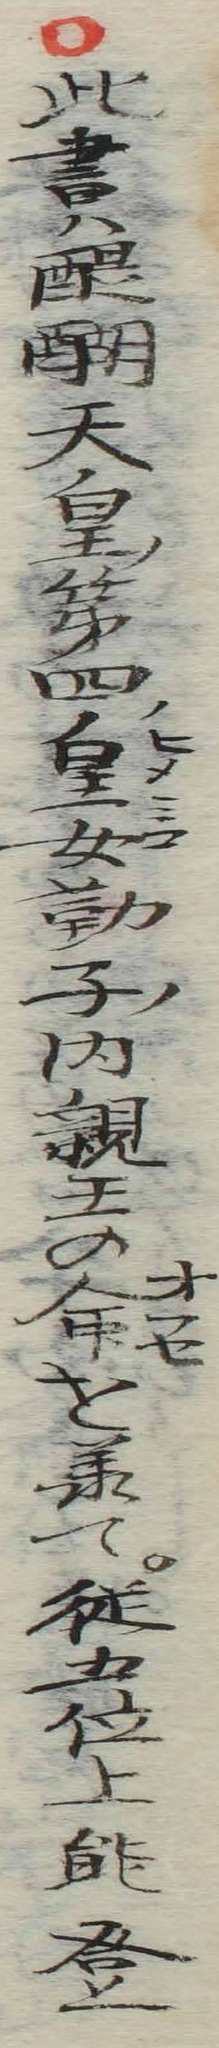〇此書は醍醐天皇第四皇女勤子内親王の命を承て。従五位上能登
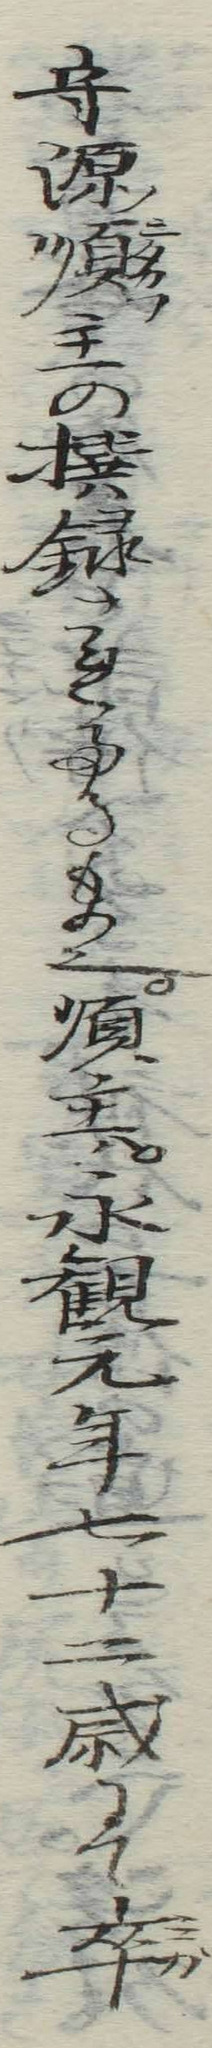守源順主の撰録されたるもの也。順主は。永観元年七十二歳にて卒
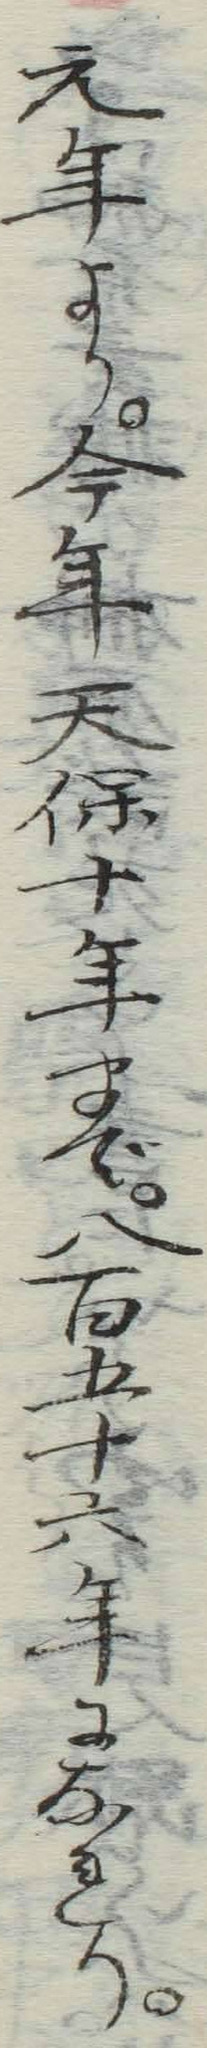元年より。今年天保十年まで。八百五十六年になれり。
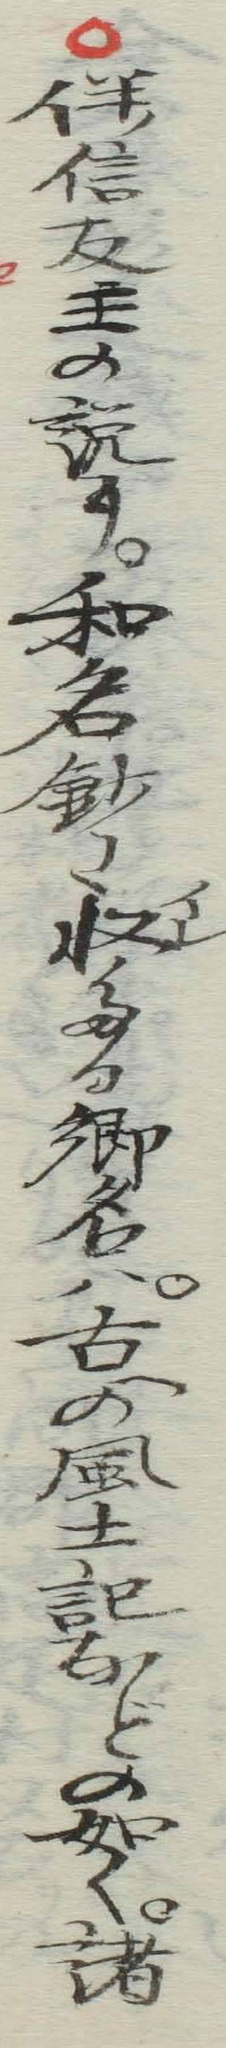〇伴信友主の説に。和名鈔に収たる郷名は。古への風土記などの如く。諸
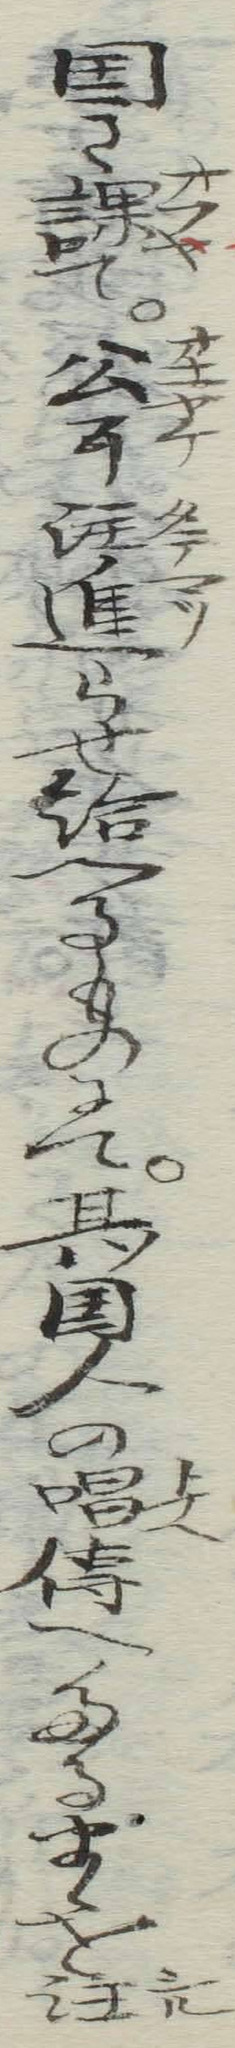国に課て。公に注進らせ給へるものにて。其国人の唱伝へたるまゝを注
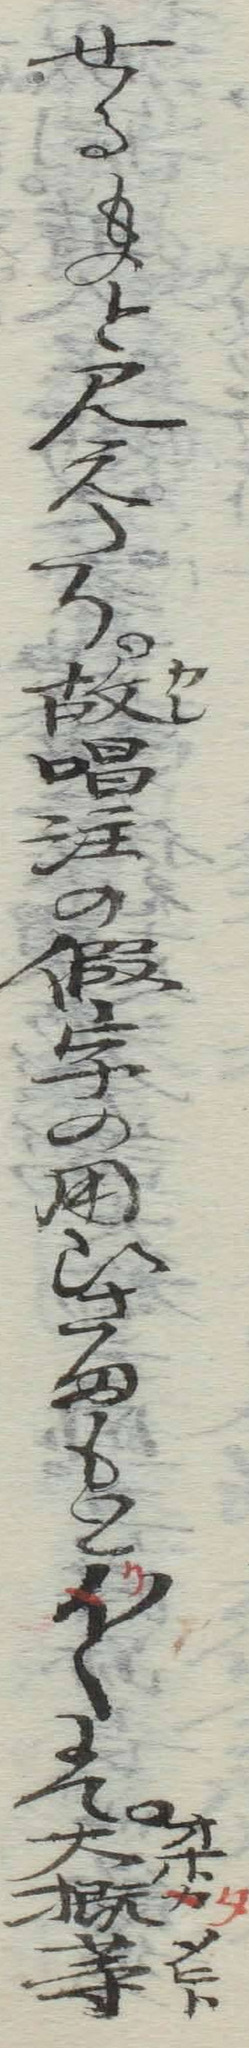せるものと見えたり。故唱注の仮字の用ひさまもとり〳〵にて。大概等
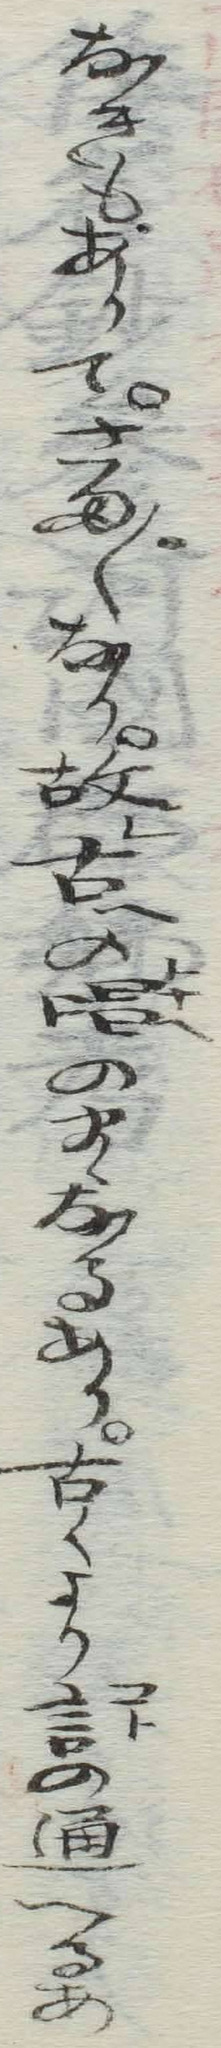なきもありて。さま〴〵なり。故古唱のまゝなるあり。古くより言の通へるあ
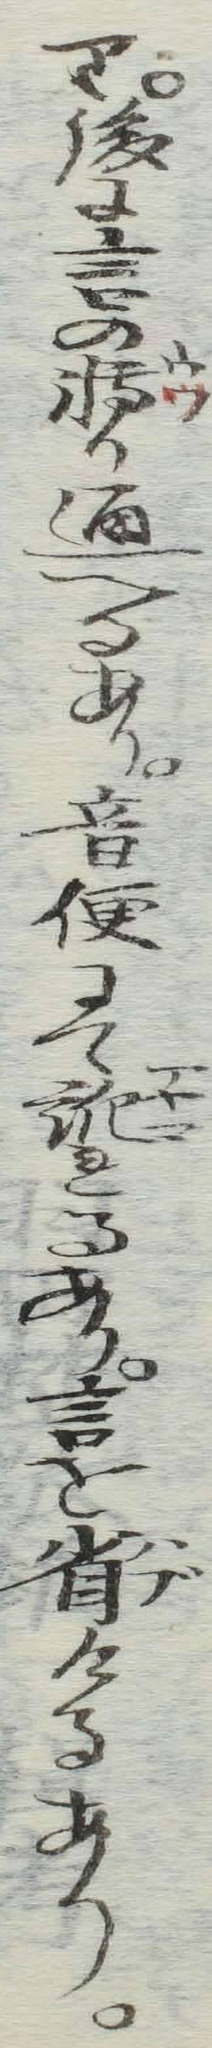り。後に言の転り通へるあり。音便にて訛れるあり。言を省けるあり。
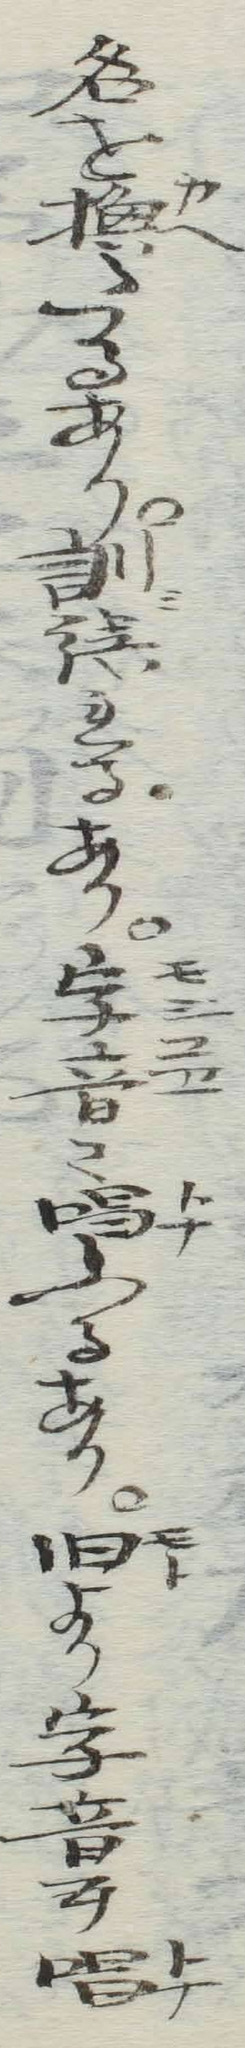名を換たるあり。訓誤れるあり。字音て唱ふるあり。旧より字音に唱
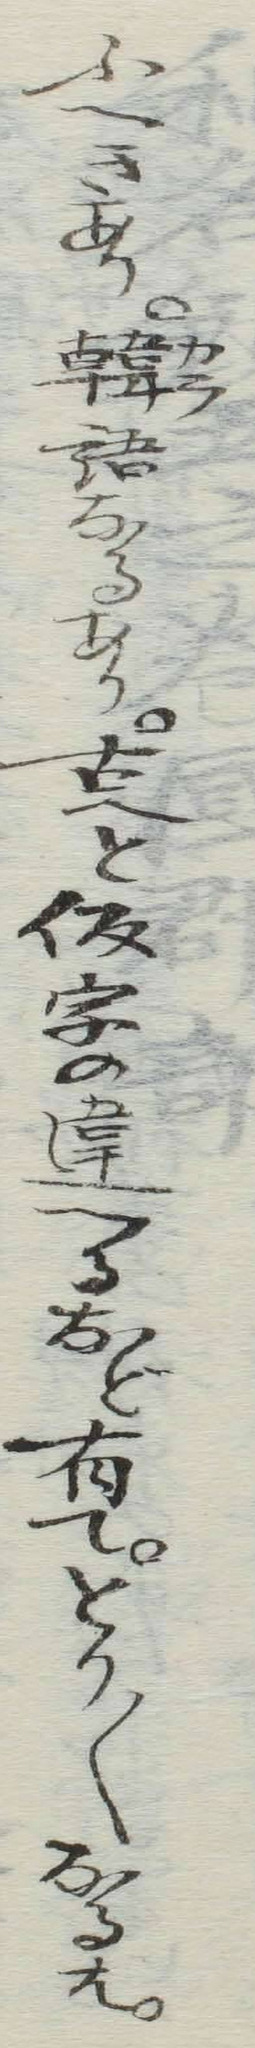ふへきあり。韓語なるあり。古へと仮字の違へるなど有て。とり〳〵なるは。
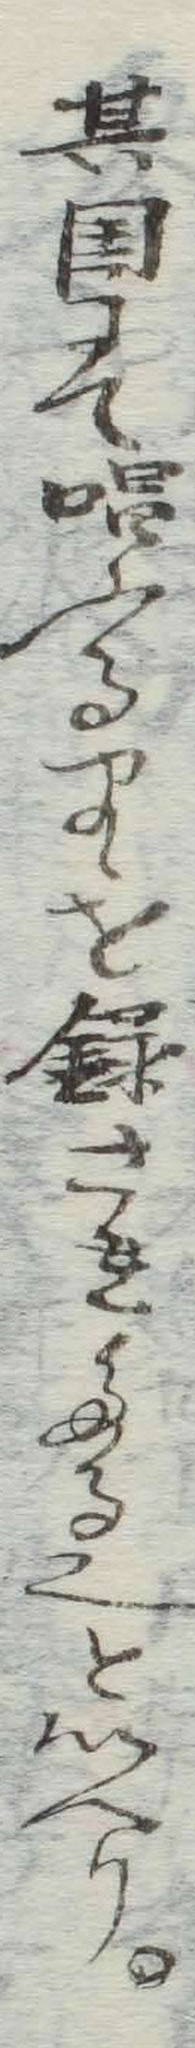其国にて唱ふるまゝを録されたる也といへり。
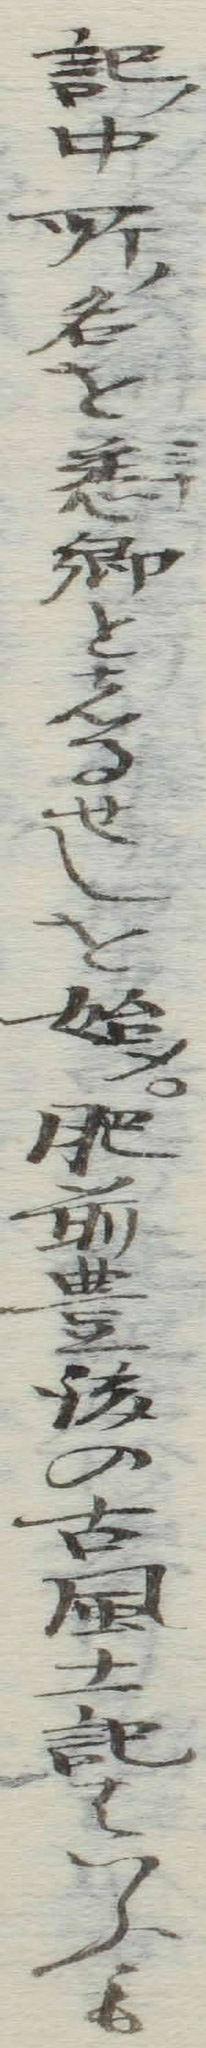記中所名を悉郷としるせしを始。肥前豊後の古風土記はいふも
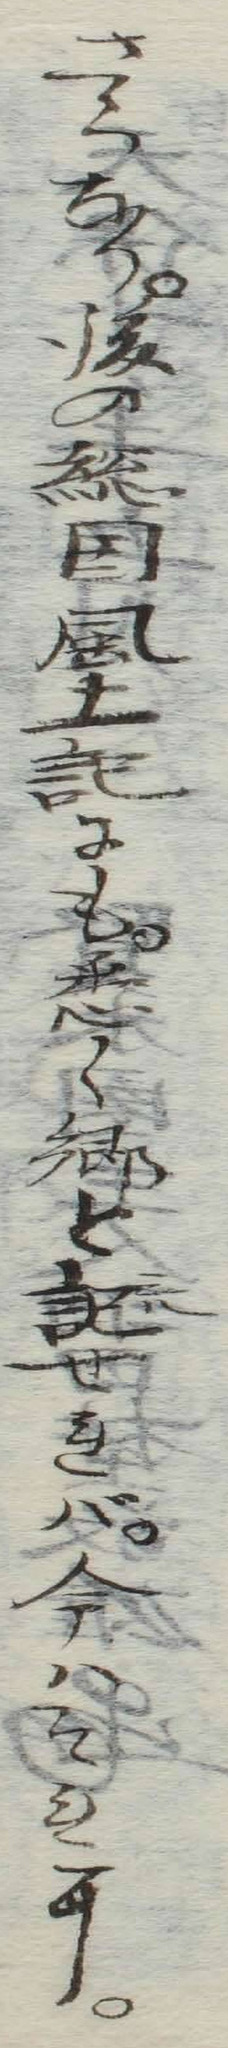さらなり。後の総国風土記にも。悉く郷と記せれば。今はそれに。
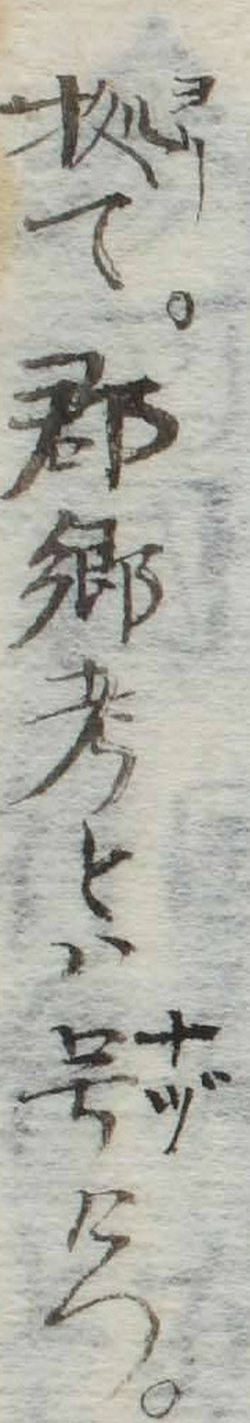拠て。郡郷考とは号けつ。

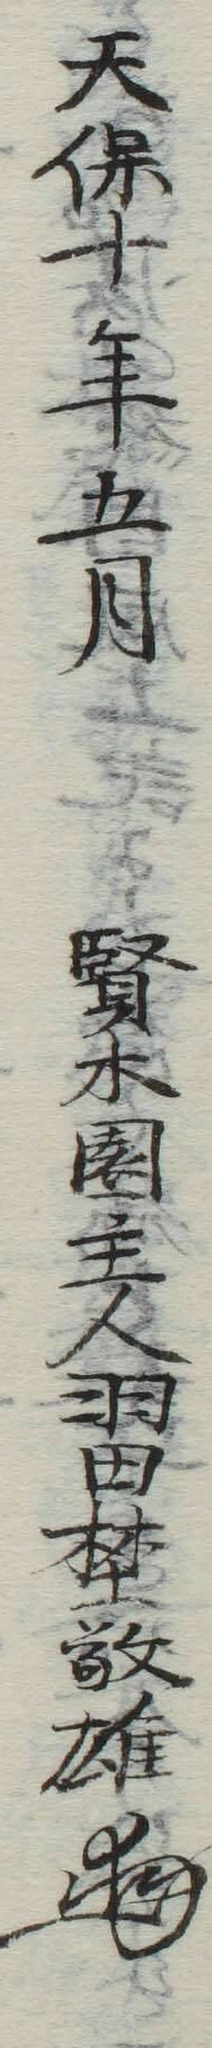天保十年五月賢木園主人羽田埜敬雄
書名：三河国古跡考
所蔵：国文学研究資料館
